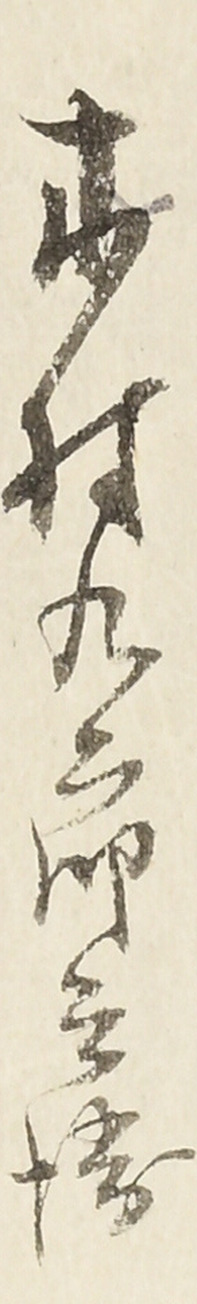木村九郎兵衛
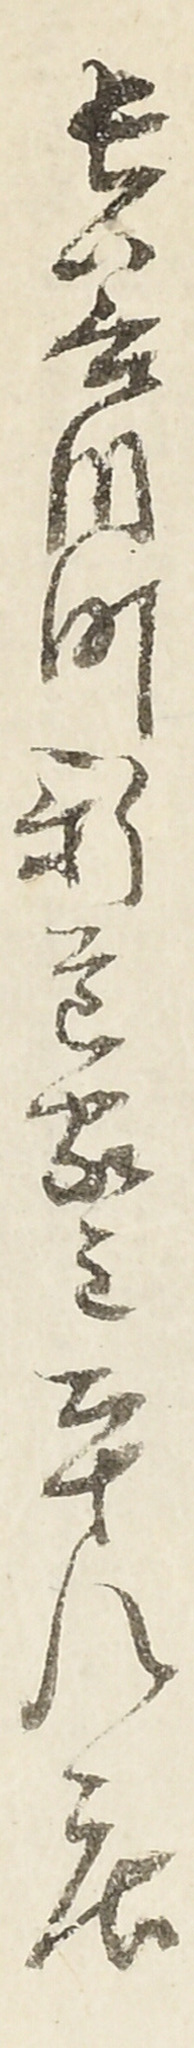長谷川町新道家主平八店
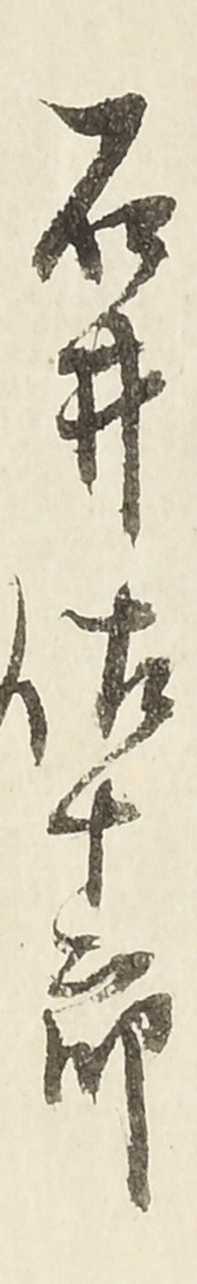石井佐十郎
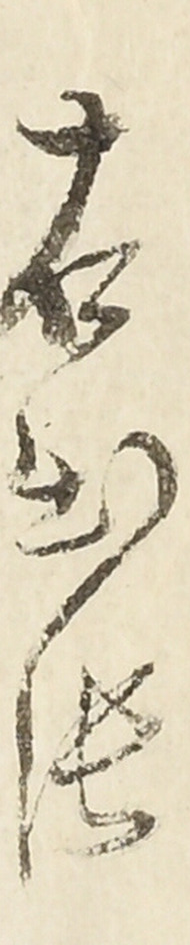右出張
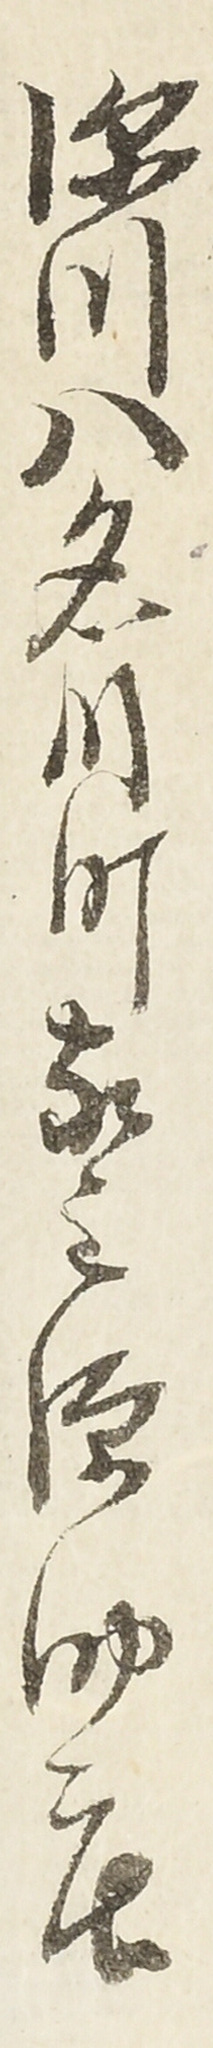深川八名川町家主源助店
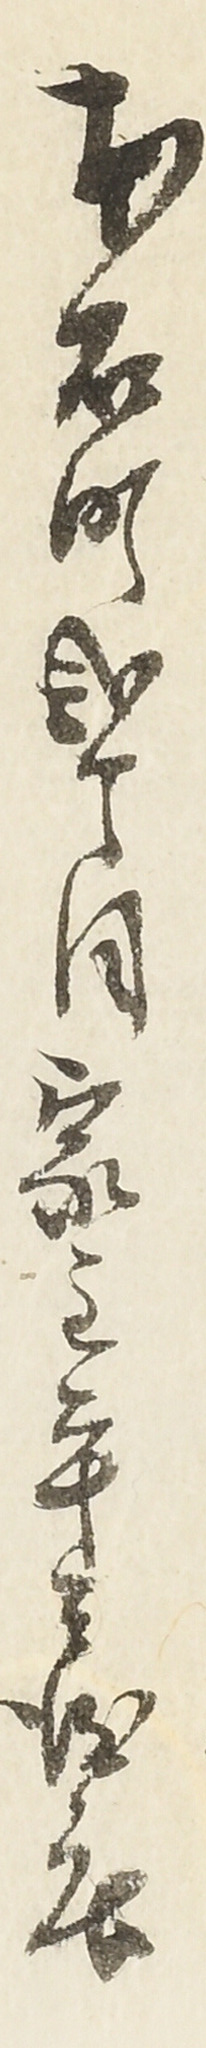本石町弐丁目家主平兵衛店
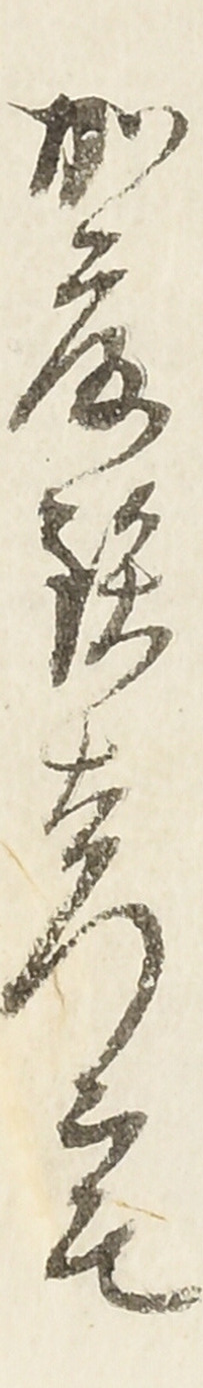加藤鉄右衛門宅
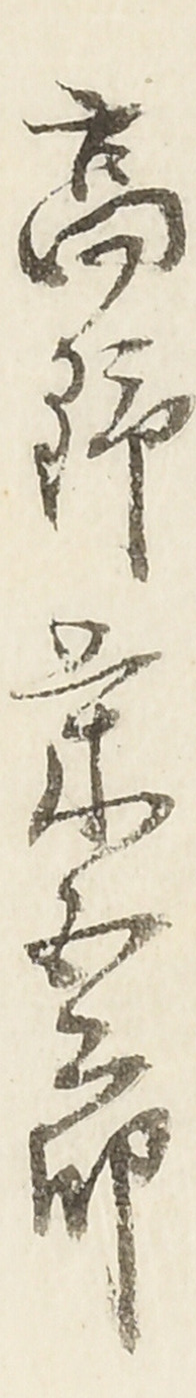高野栄五郎
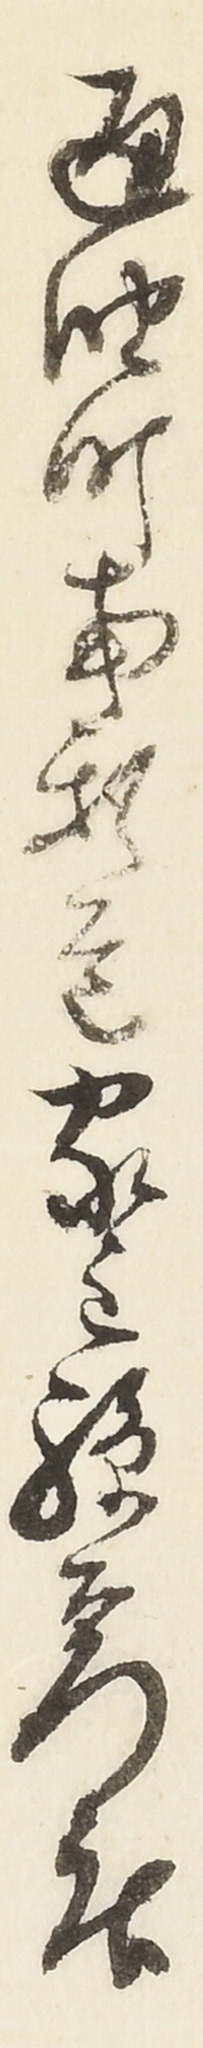通油町南新道家主孫右衛門店
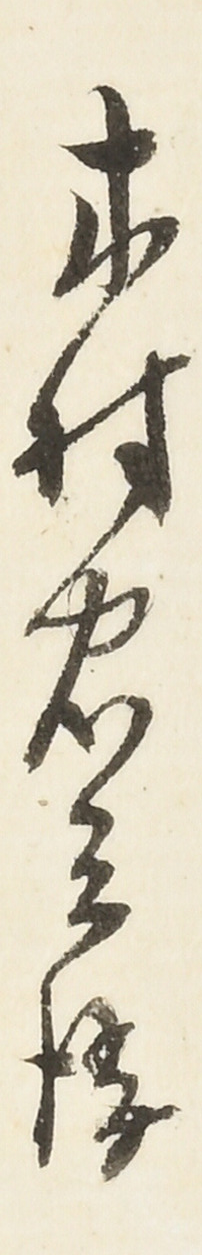木村忠兵衛
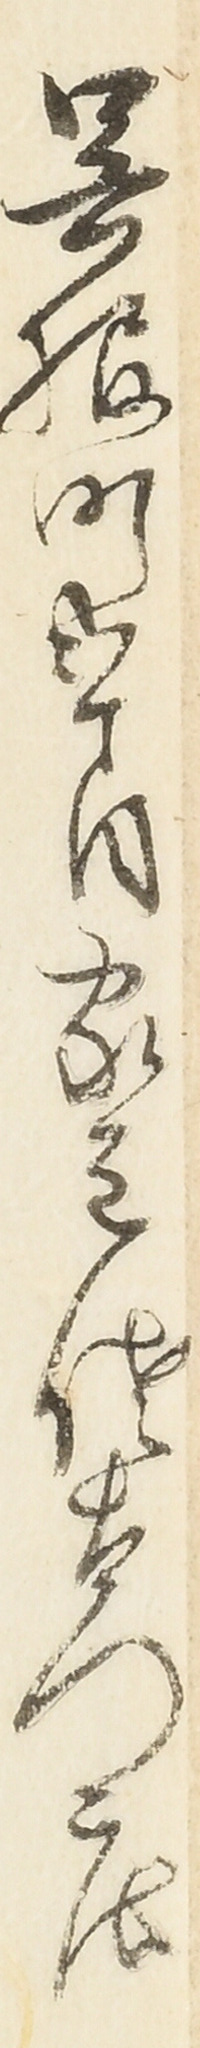呉服町弐丁目家主佐右衛門店
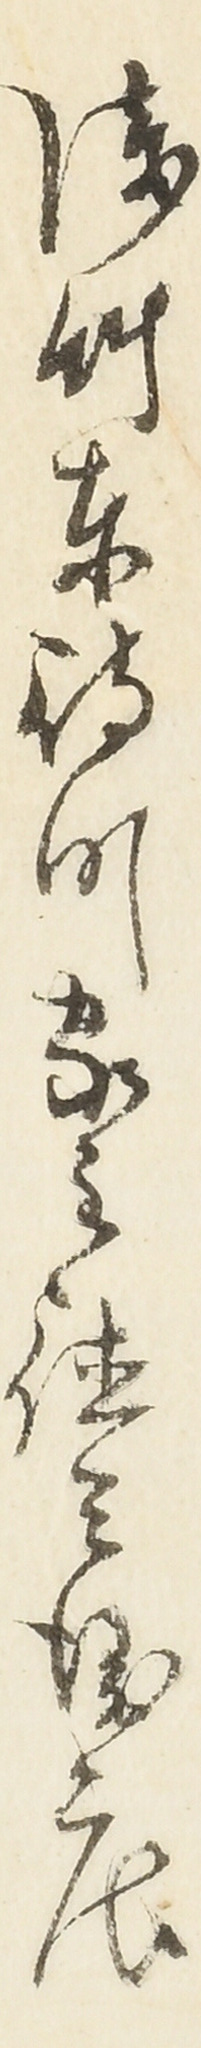浅草東待町家主徳兵衛店
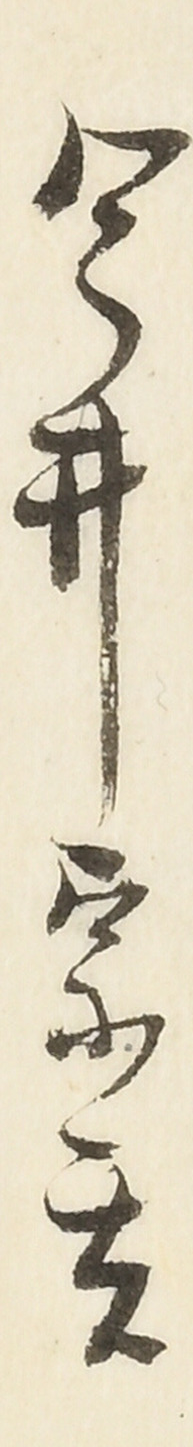今井宗玄
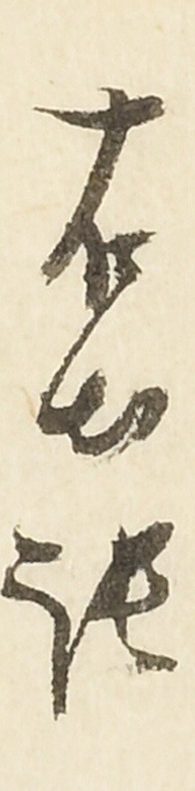右出張
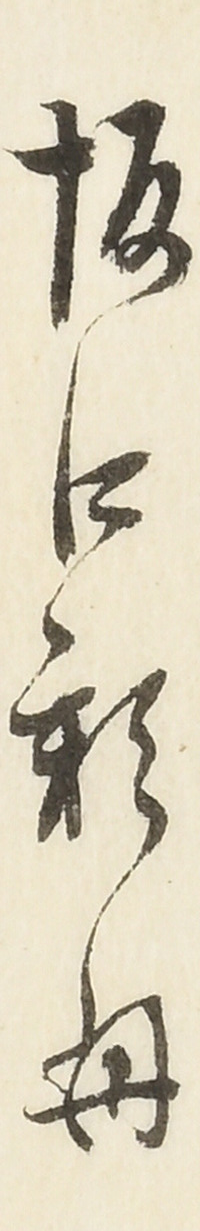坂口頼母
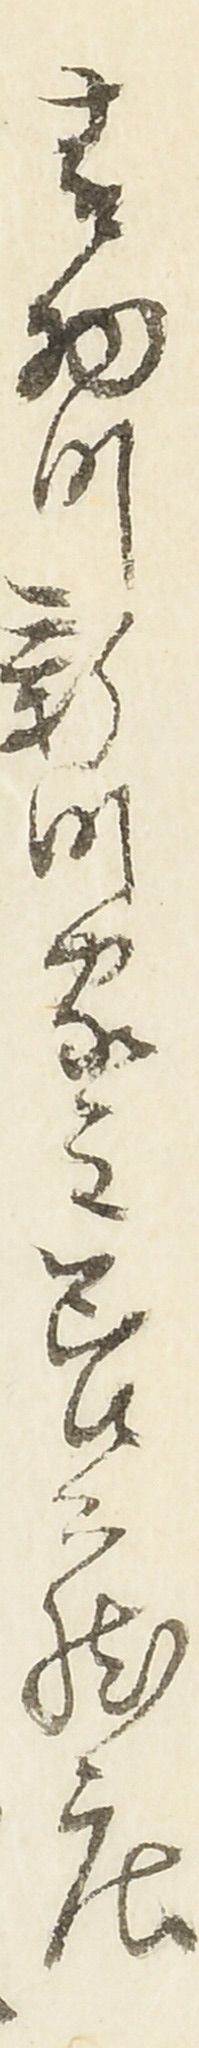古物町新町家主善蔵店
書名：秘書
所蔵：伊那市立高遠町図書館・合同会社AMANE
